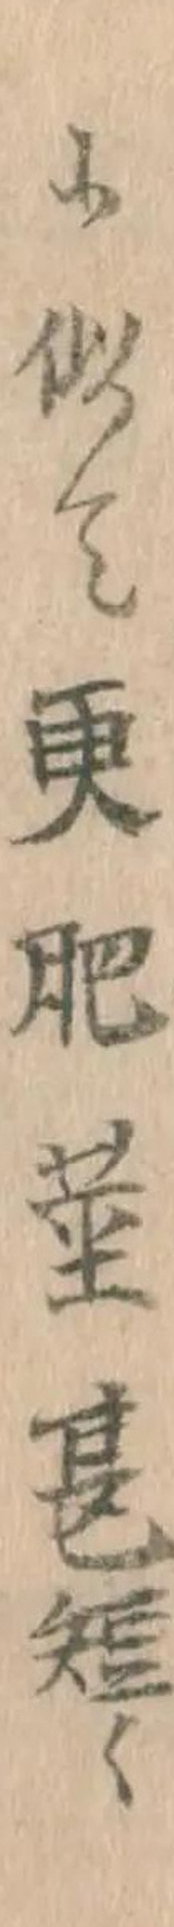に似て更肥茎甚短く
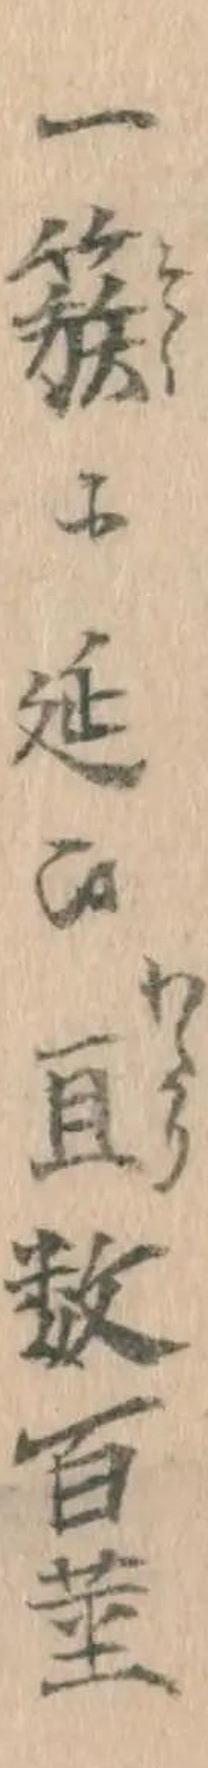一簇に延ひ亘数百茎
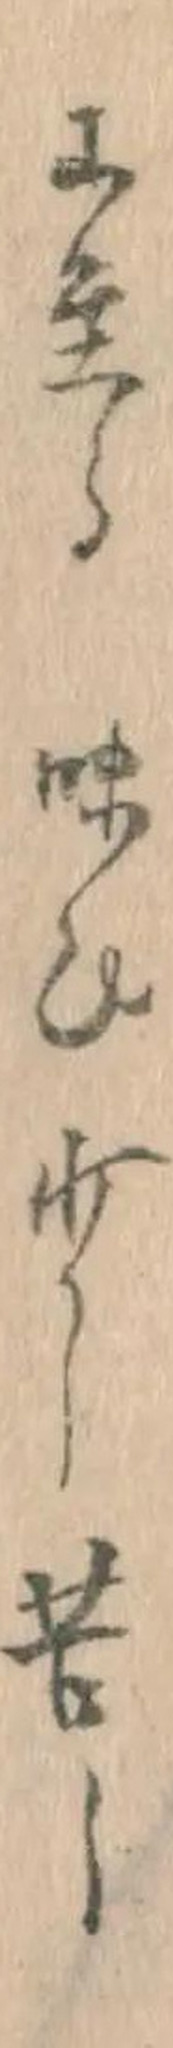に至る味ひ少し苦し
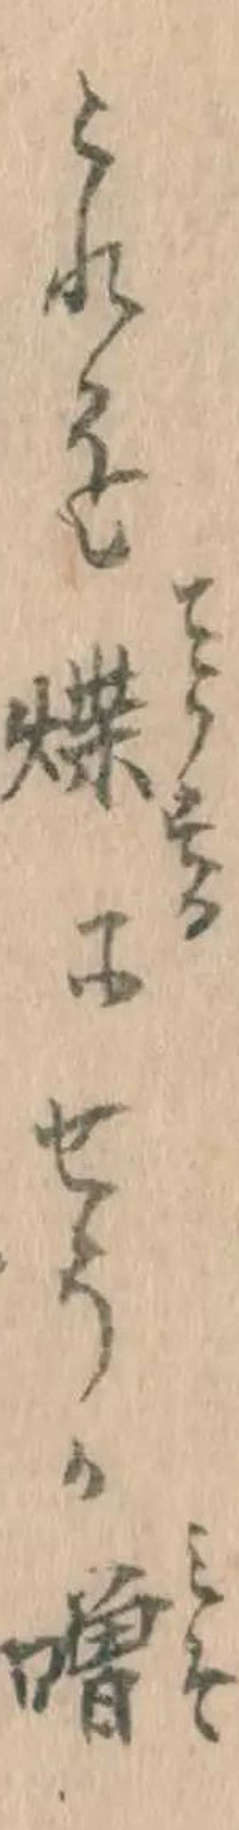これを煠にせうか噌
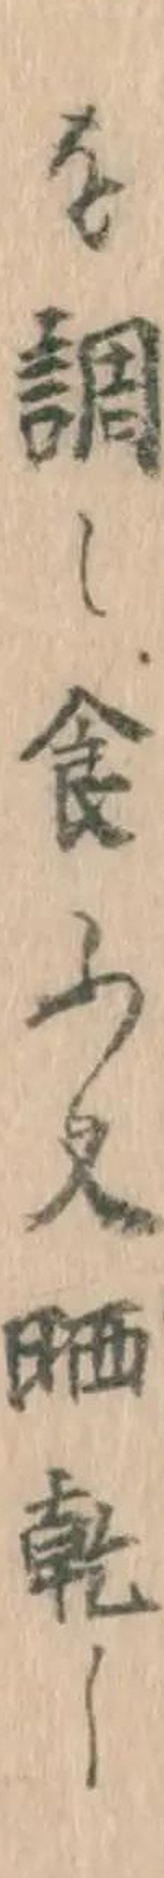を調し食ふ又晒乾し
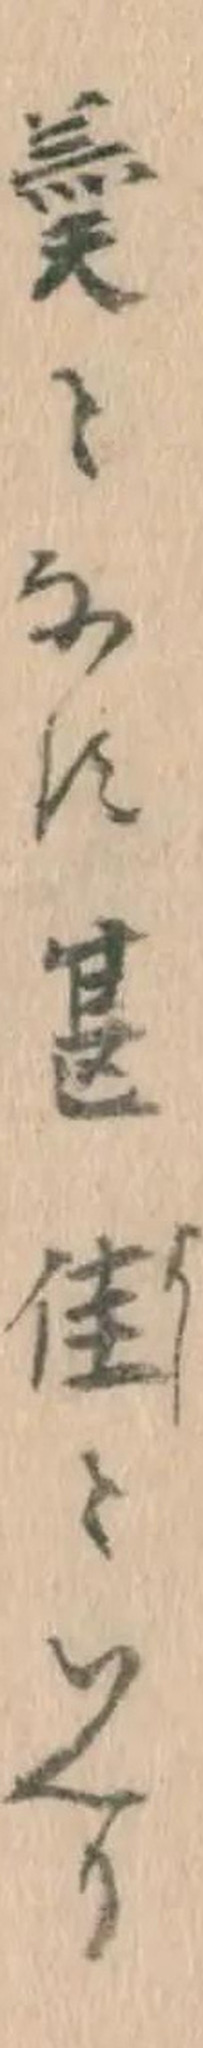羹となす甚佳といへり
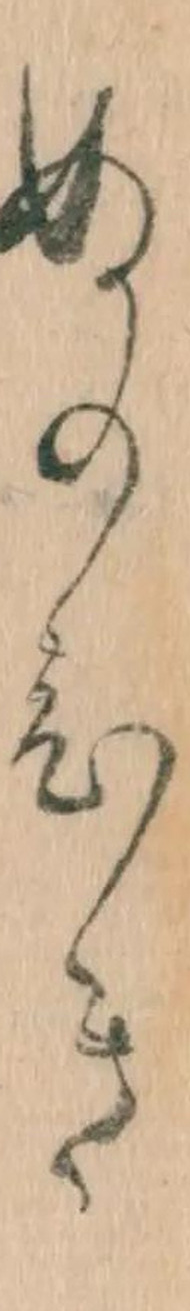ぬのひき
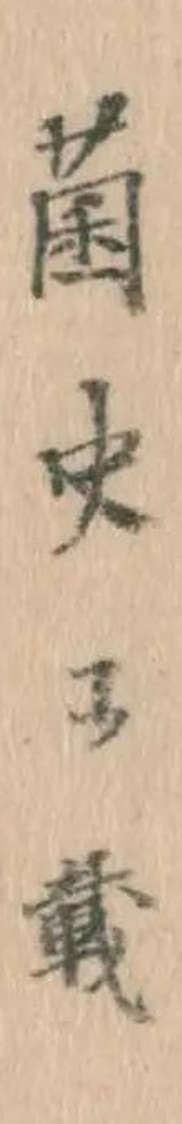菌史に載

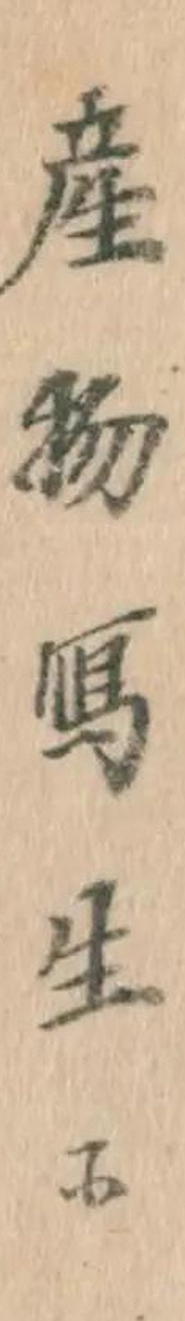産物写生に
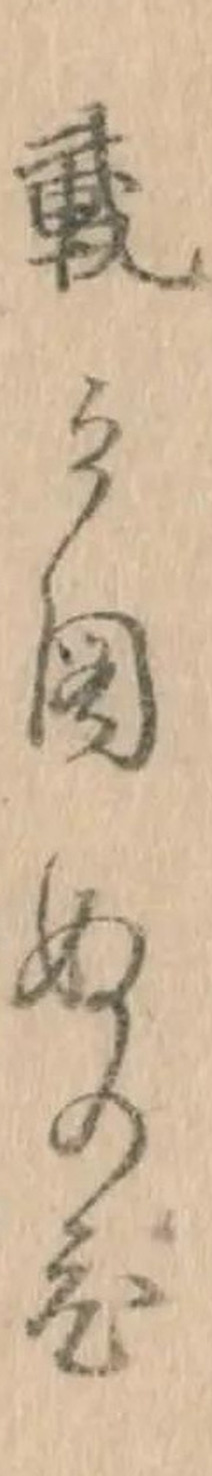載る図ぬのひ
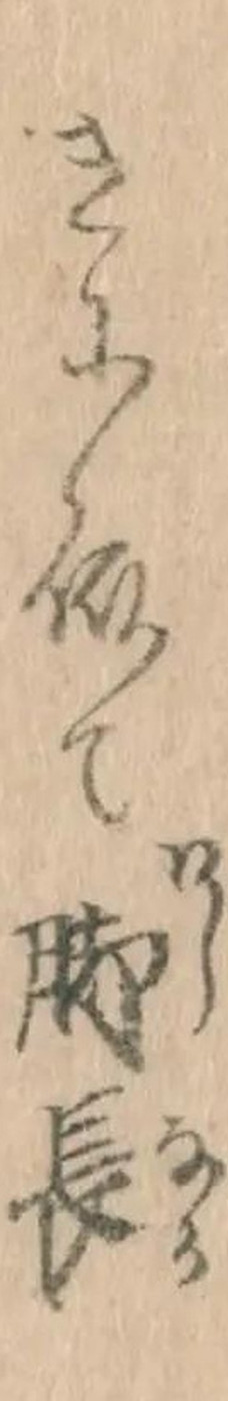きに似て脚長
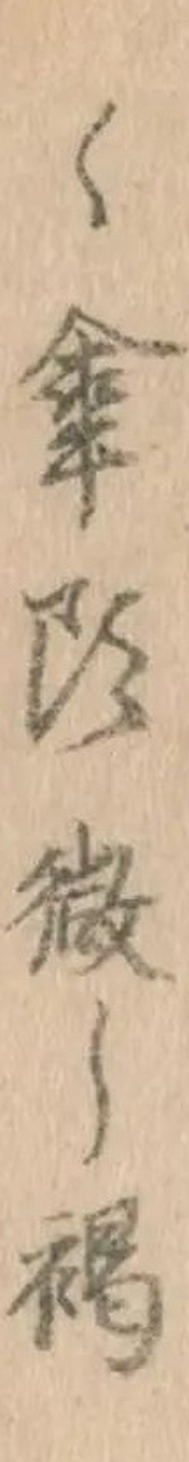く傘頭微し褐
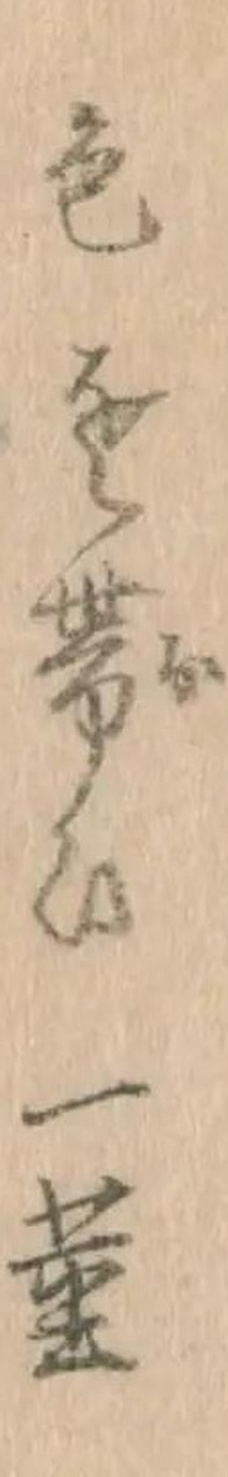色を帯ひ一茎
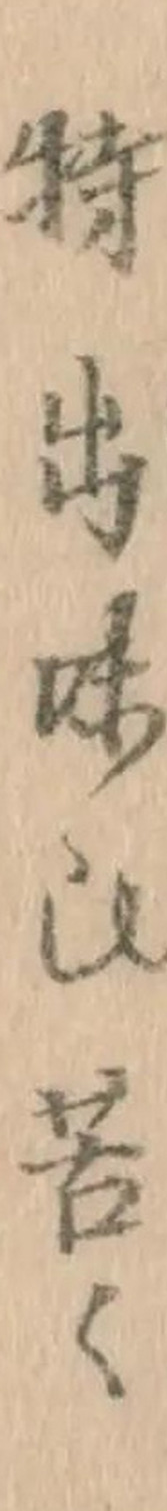特出味ひ苦く
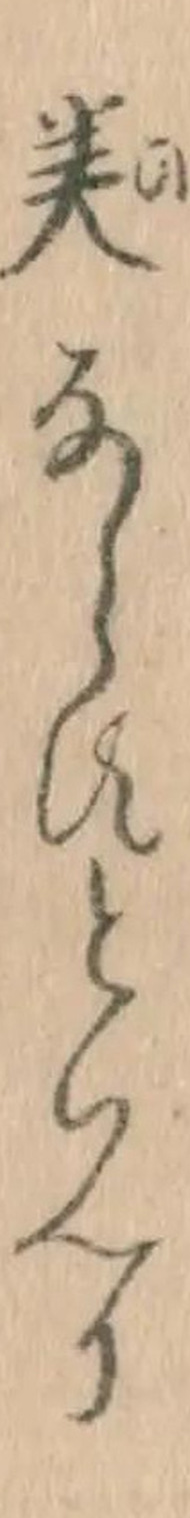美ならすといへり
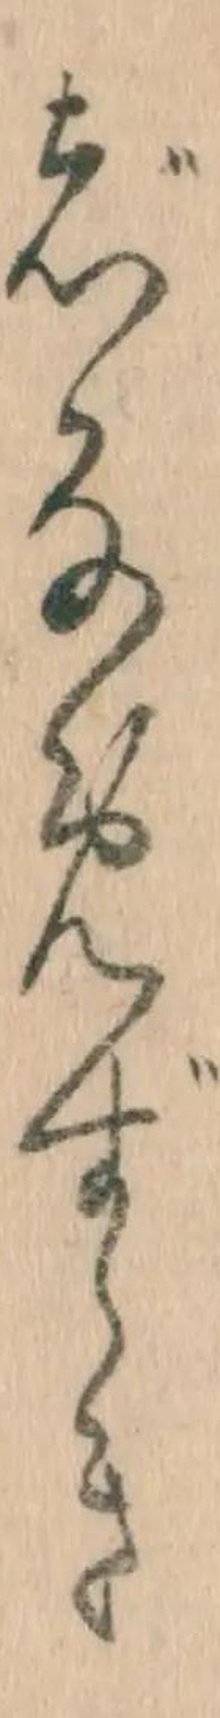じなめずゝき
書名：本草図譜. 巻58-60
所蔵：国立国会図書館 National Diet Library, JAPAN
